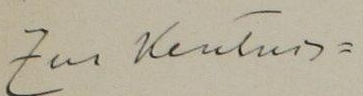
Zur Kentnis-
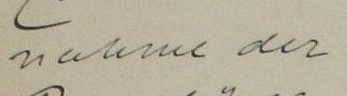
nahme der
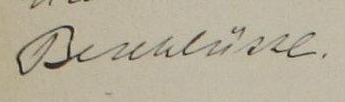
Beschlüsse.
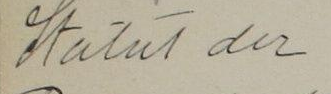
Statut der
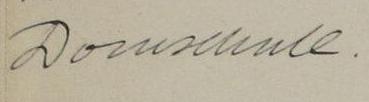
Domschule.
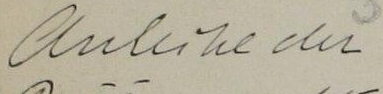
Anleihe der
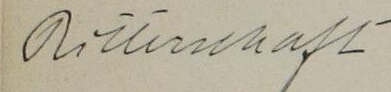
Ritterschaft
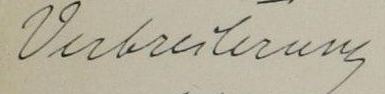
Verbreiterung
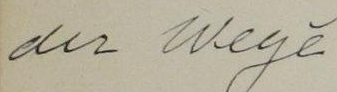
der Wege
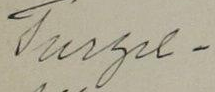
Turgel-
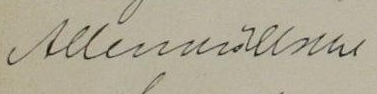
Allenküllsche
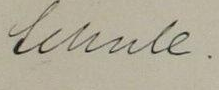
Schule
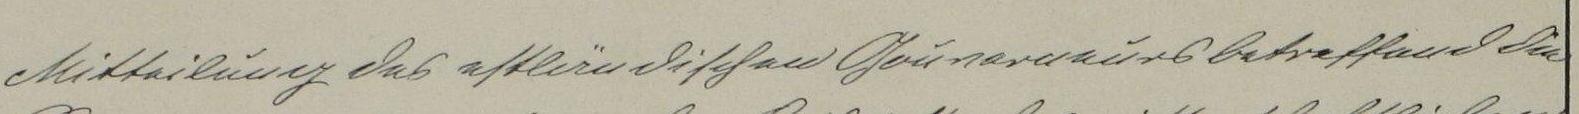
Mitteilung des estländischen Gouverneurs betreffend die
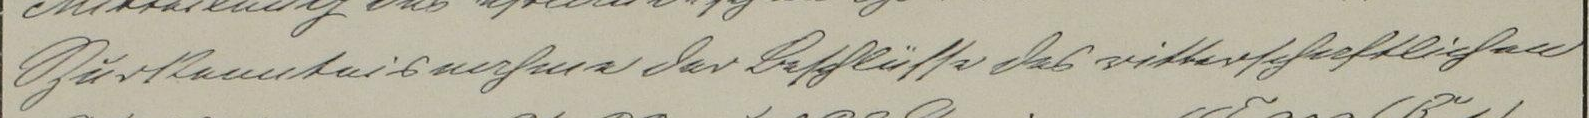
Zurkenntnisnahme der Beschlüsse des ritterschaftlichen
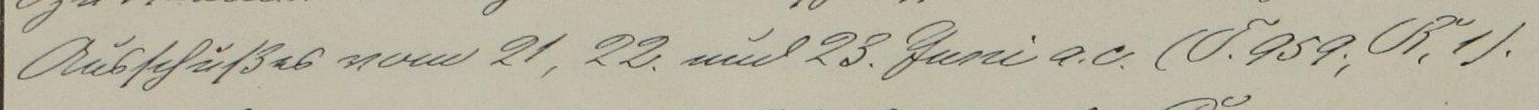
Ausschußes vom 21, 22. und 23. Juni a.c. (T.959; R.1).
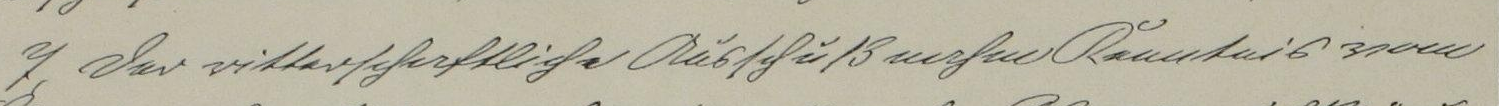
7. Der ritterschaftliche Ausschuß nahm Kenntnis vom
